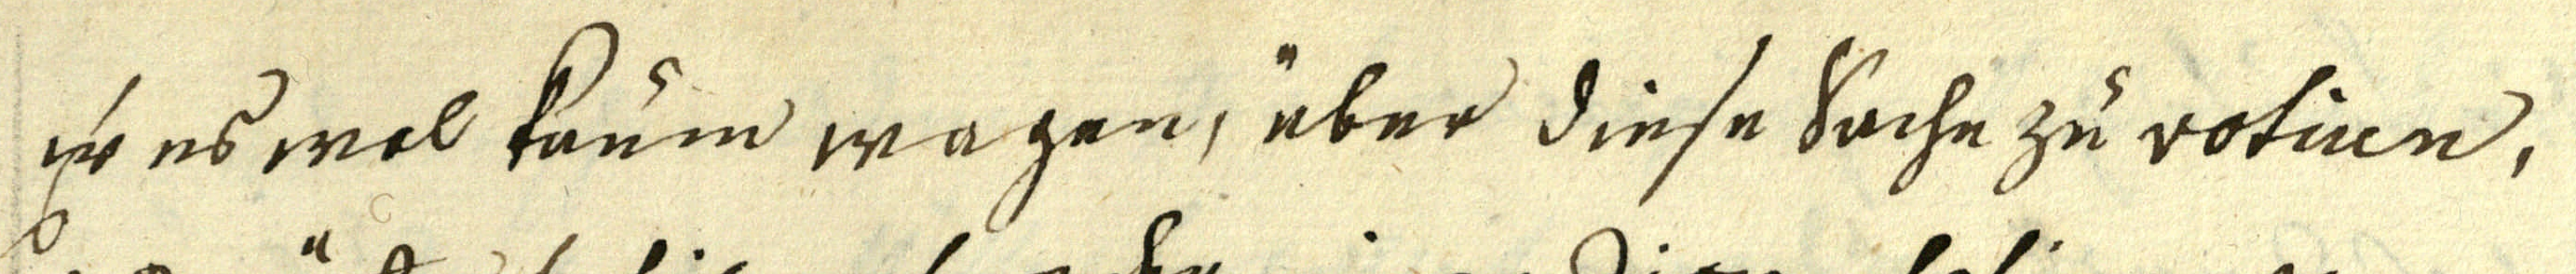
Er es wol kaum wagen, über diese Sache zu votiren,
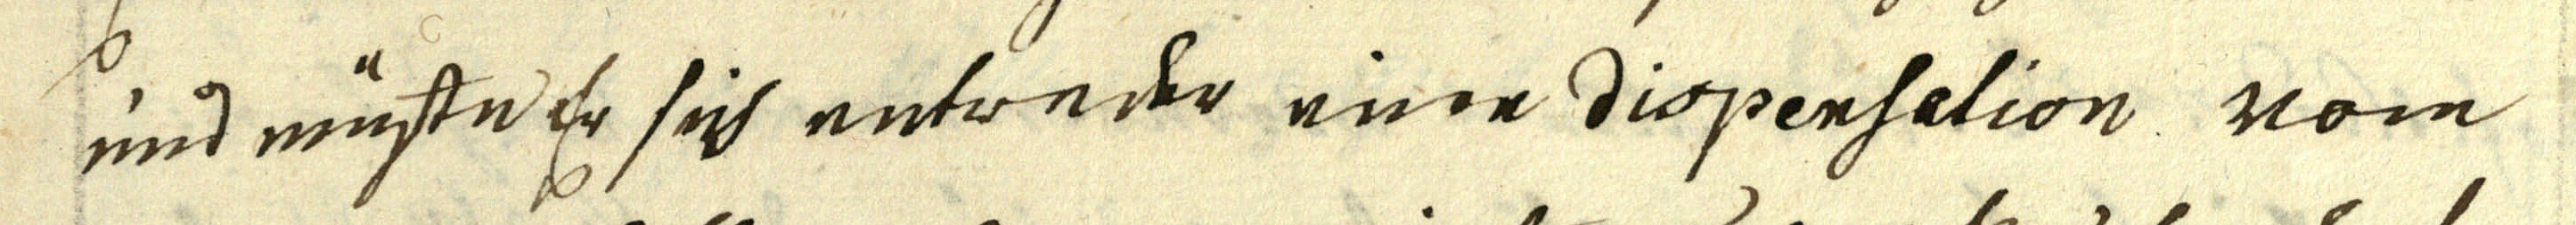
und müste Er sich entweder eine dispensation vom
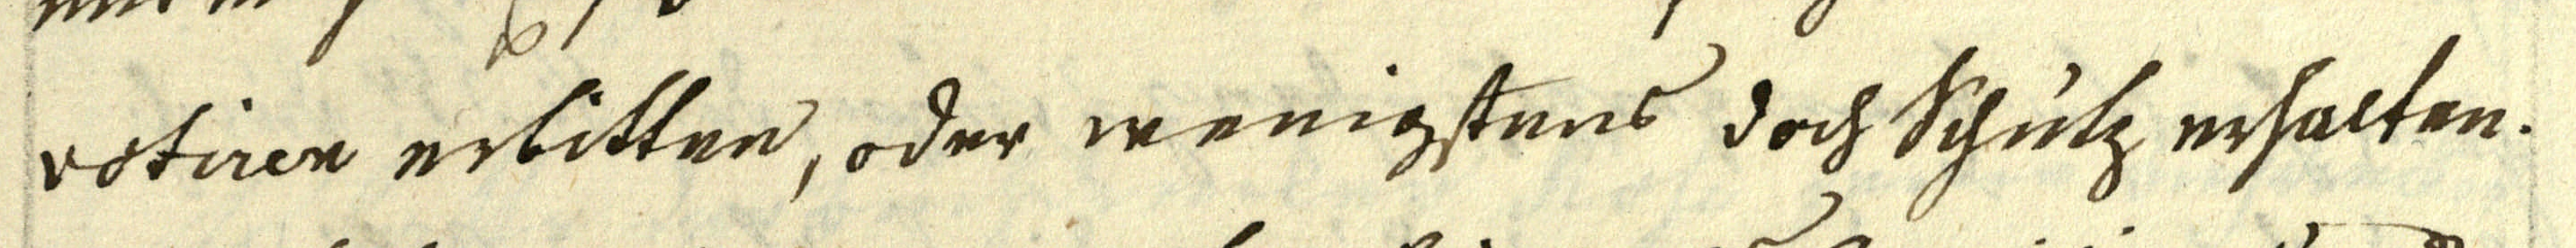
votiren erbitten, oder wenigstens doch Schutz erhalten.
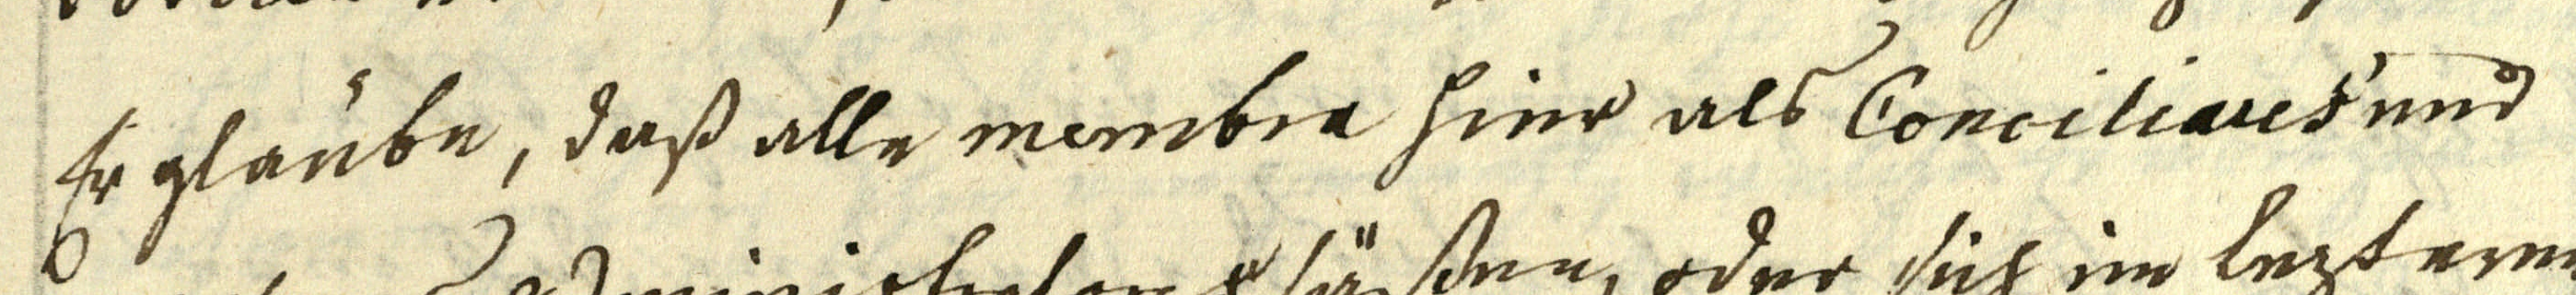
Er glaube, daß alle membra hier als Conciliares und
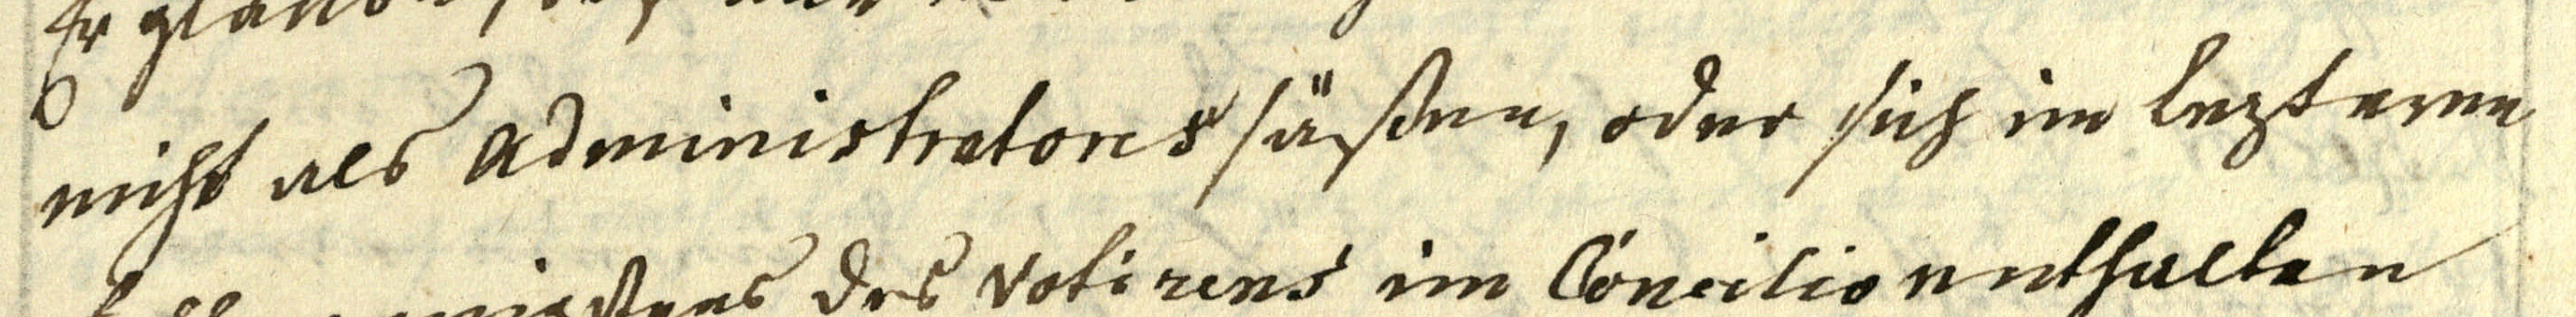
nicht als Administratores säßen, oder sich im lezteren
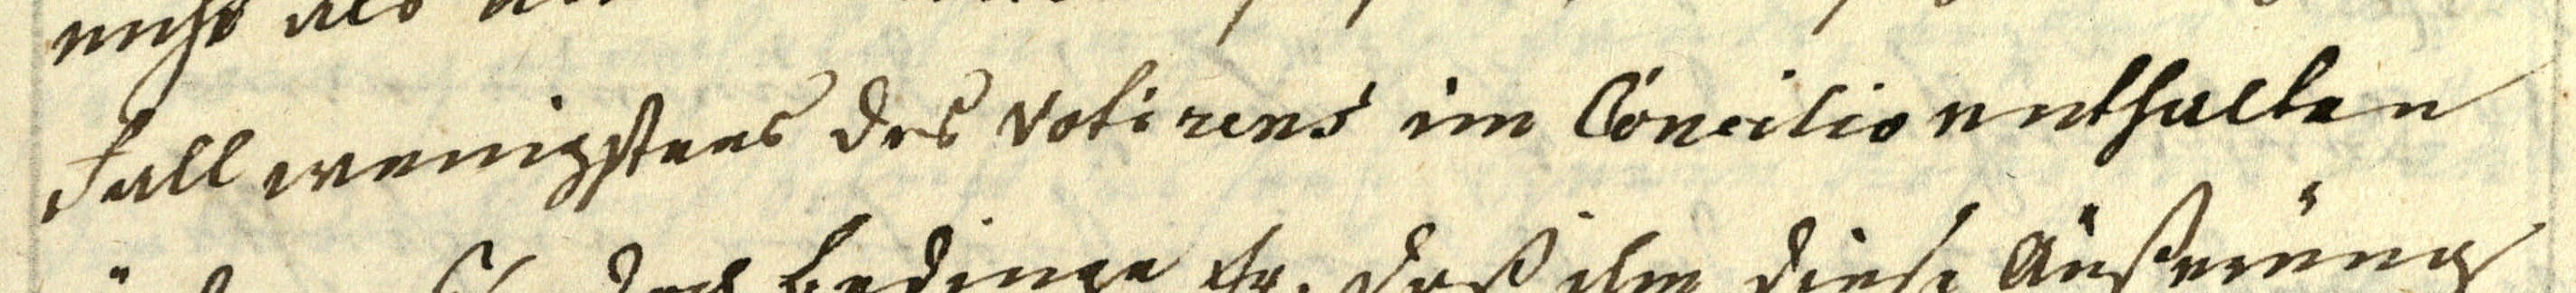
Fall wenigstens des votirens im Concilio enthalten
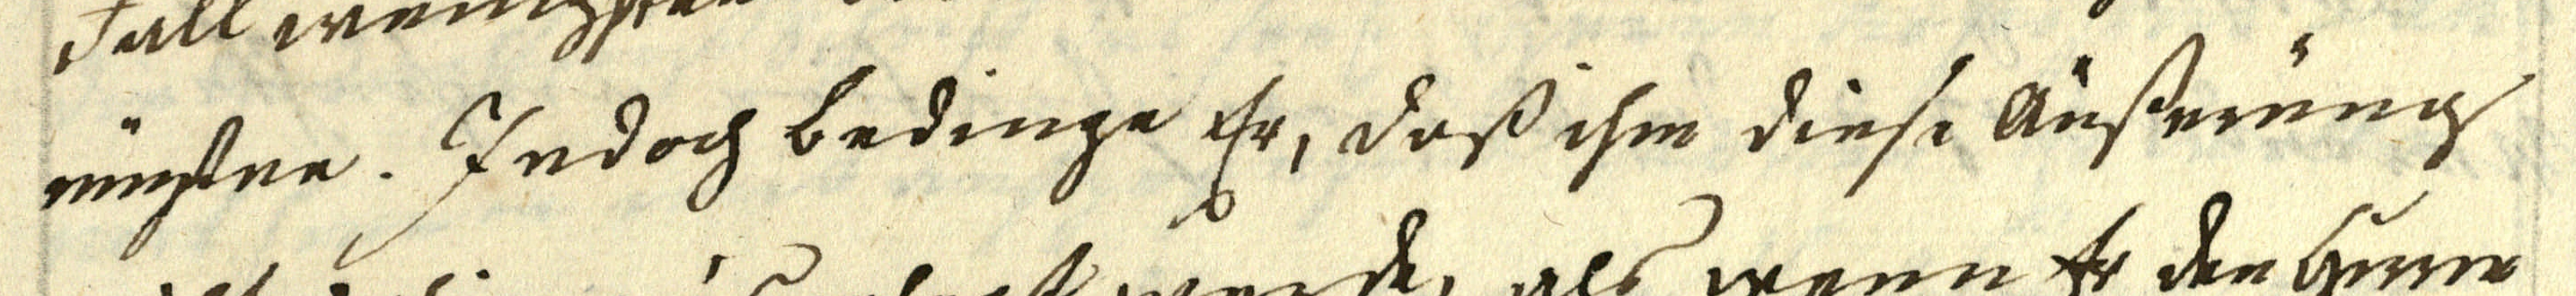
müsten. Jedoch bedinge Er, daß ihm diese Äußerung
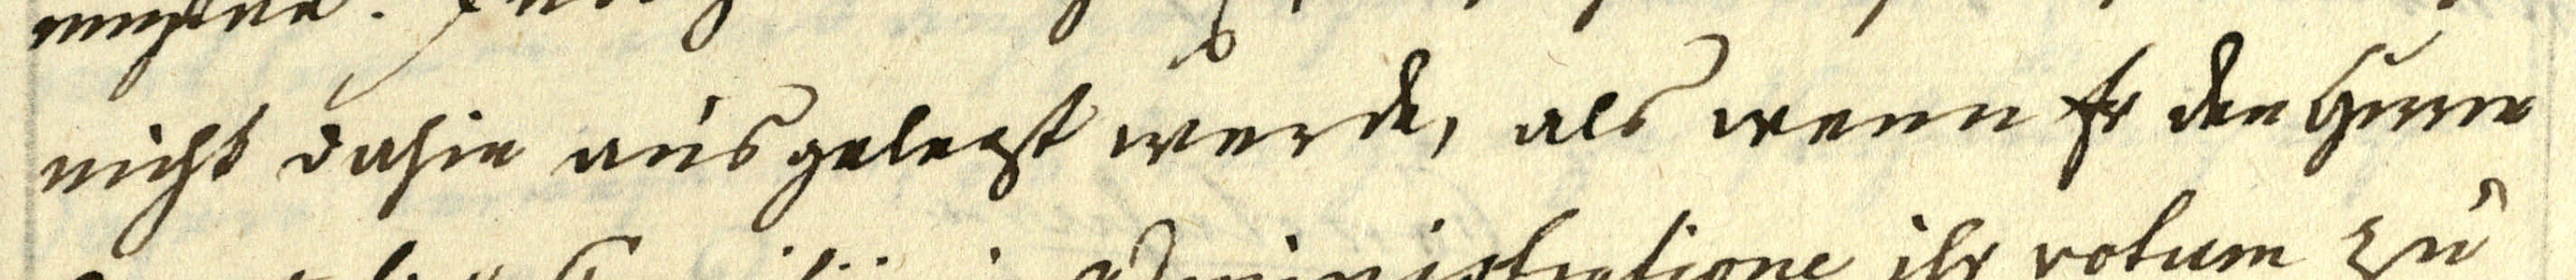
nicht dahin ausgelegt werde, als wenn Er den Herrn
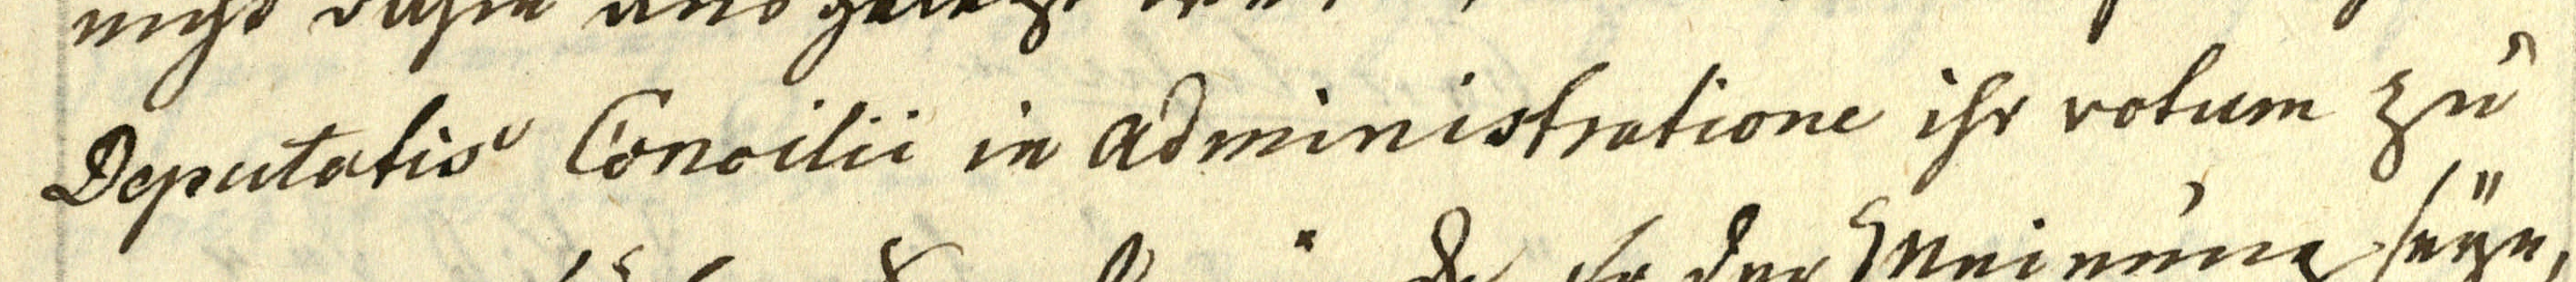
Deputatis Concilii in Administratione ihr votum zu
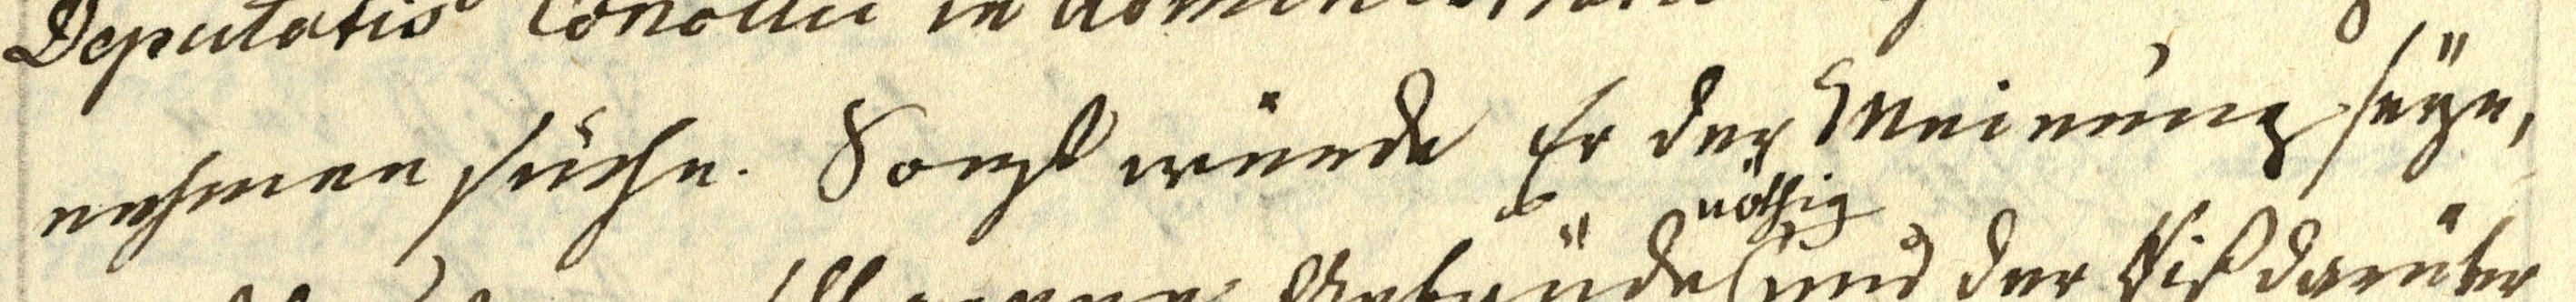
nehmen suche. Sonst würde Er der Meinung seÿn,
